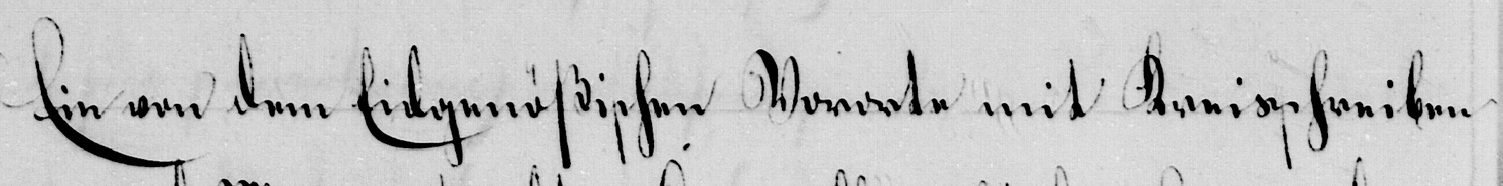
Ein von dem Eidgenößischen Vororte mit Kreisschreiben
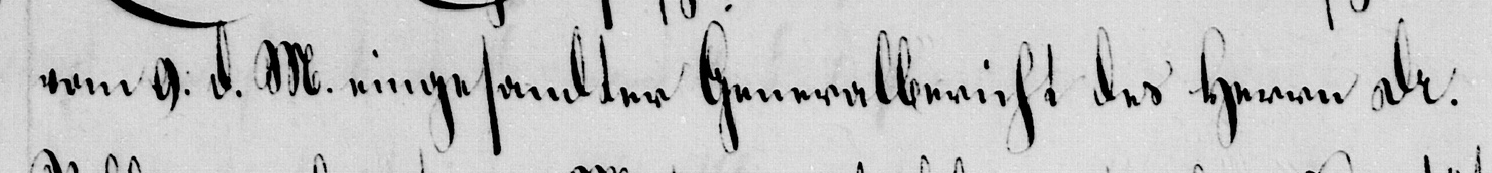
vom 9. d. M. eingesandter Generalbericht des Herrn Dr.
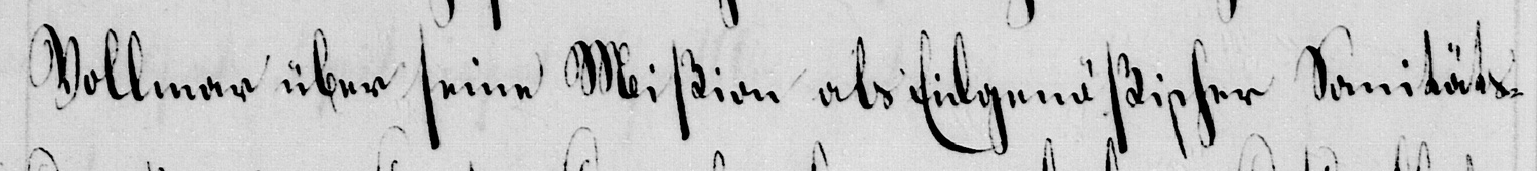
Vollmer über seine Mißion als Eidgenößischer Sanität¬
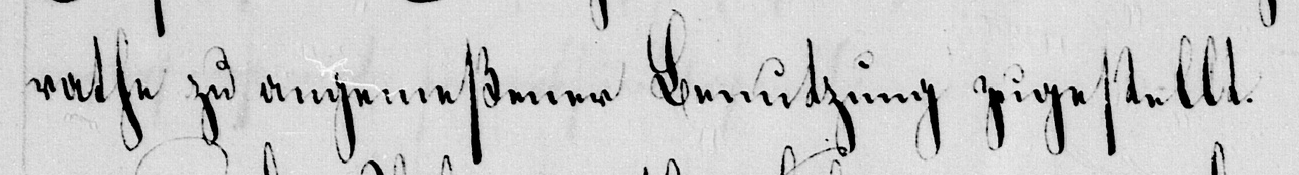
rathe zu angemeßener Benutzung zugestellt.
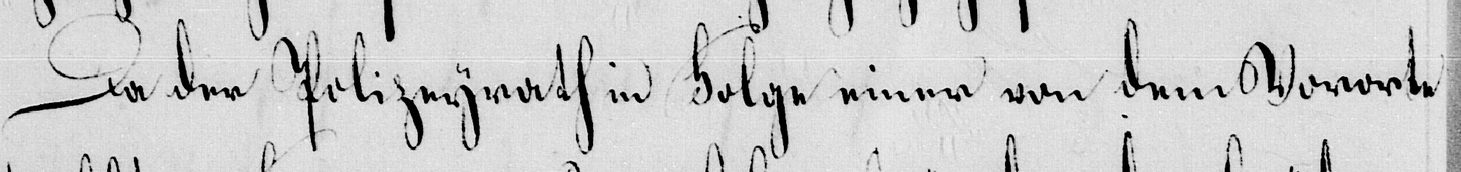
Da der Polizeyrath in Folge einer von dem Vororte
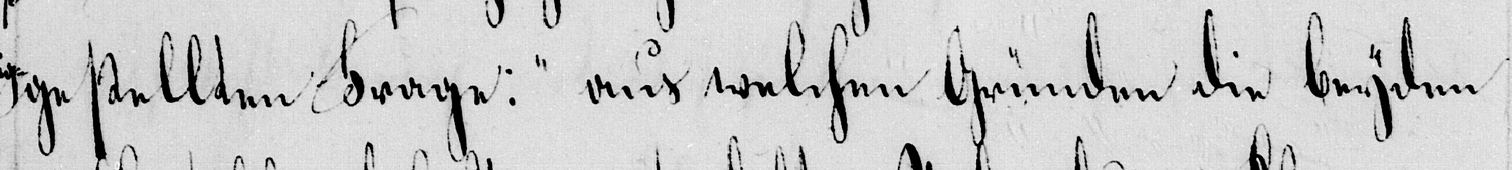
gestellten Frage: „aus welchen Gründen die beyden
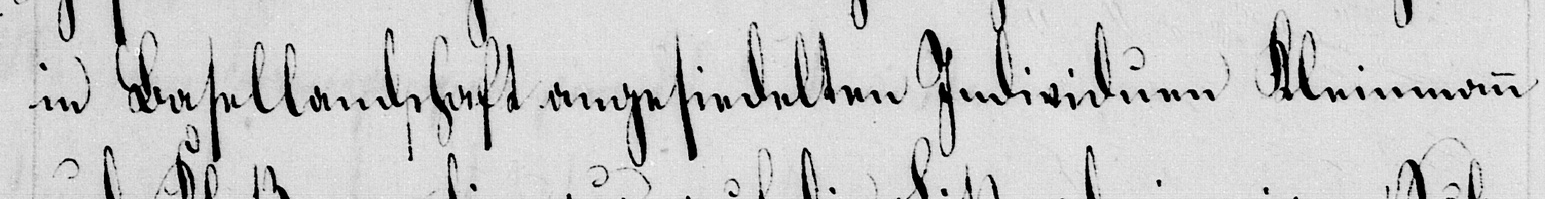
in Basellandschaft angesiedelten Individuen Kleinmann
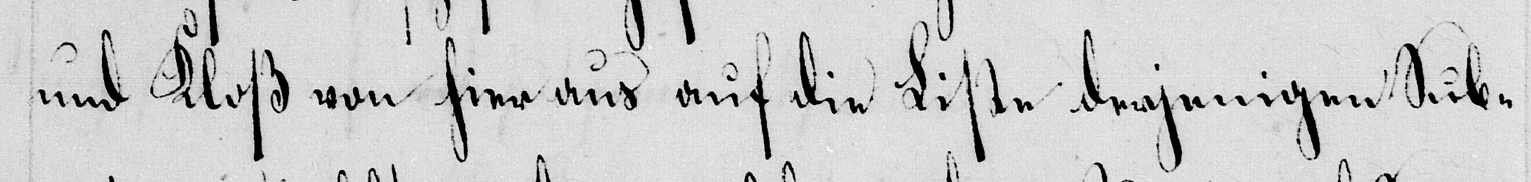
und Kloß von hier aus auf die Liste derjenigen Sub¬
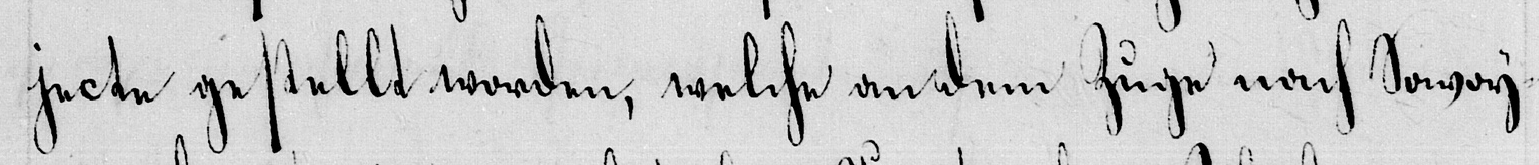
jecte gestellt worden, welche an dem Zuge nach Savoy¬
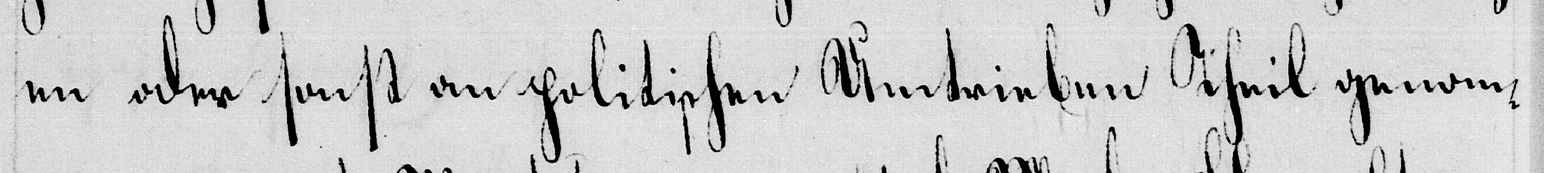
en oder sonst an politischen Umtrieben Theil genom¬
